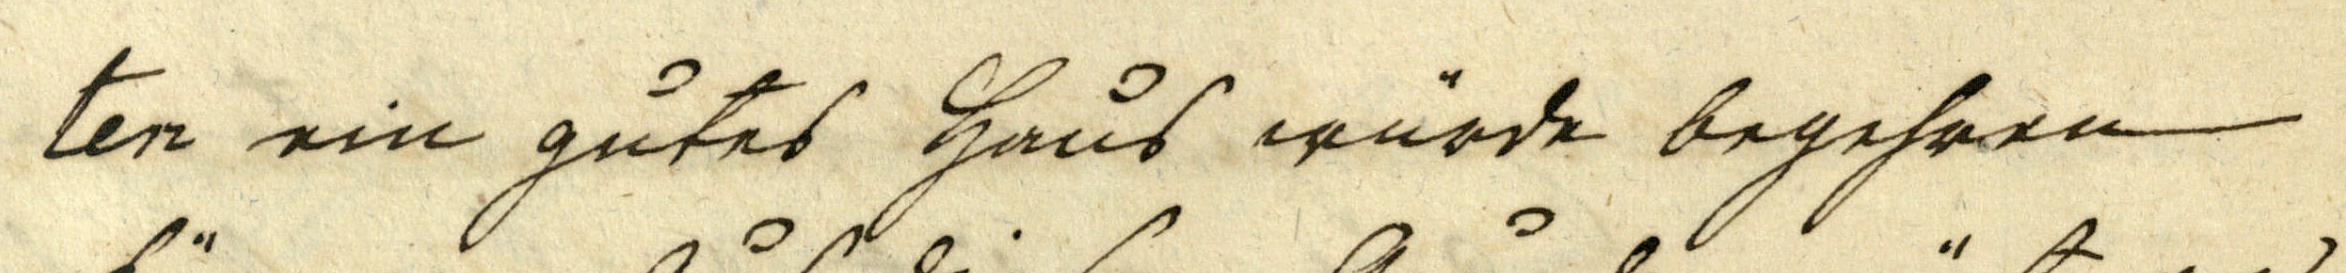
ten ein gutes Haus würde begehren
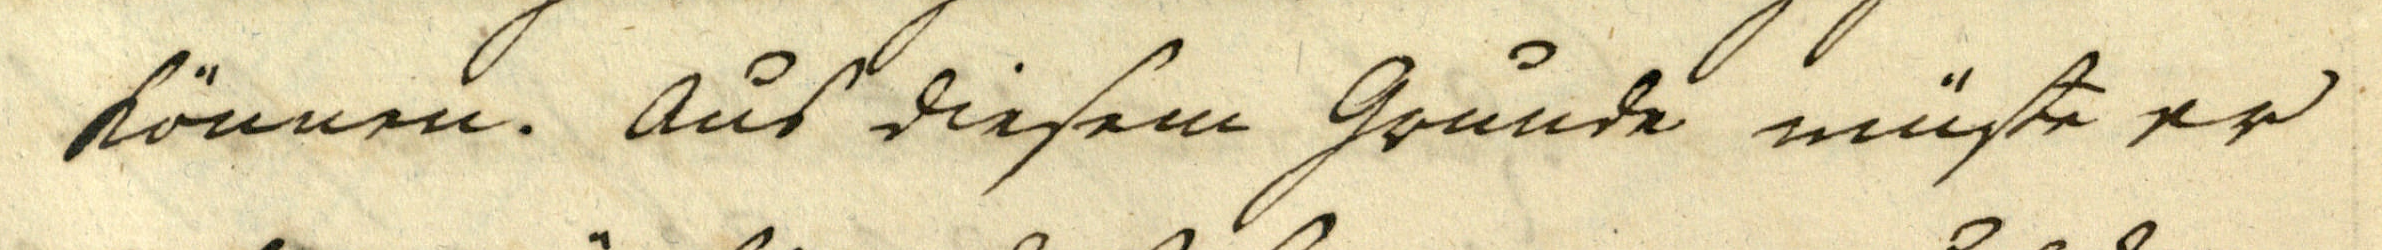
können. Aus diesem Grunde müßte er
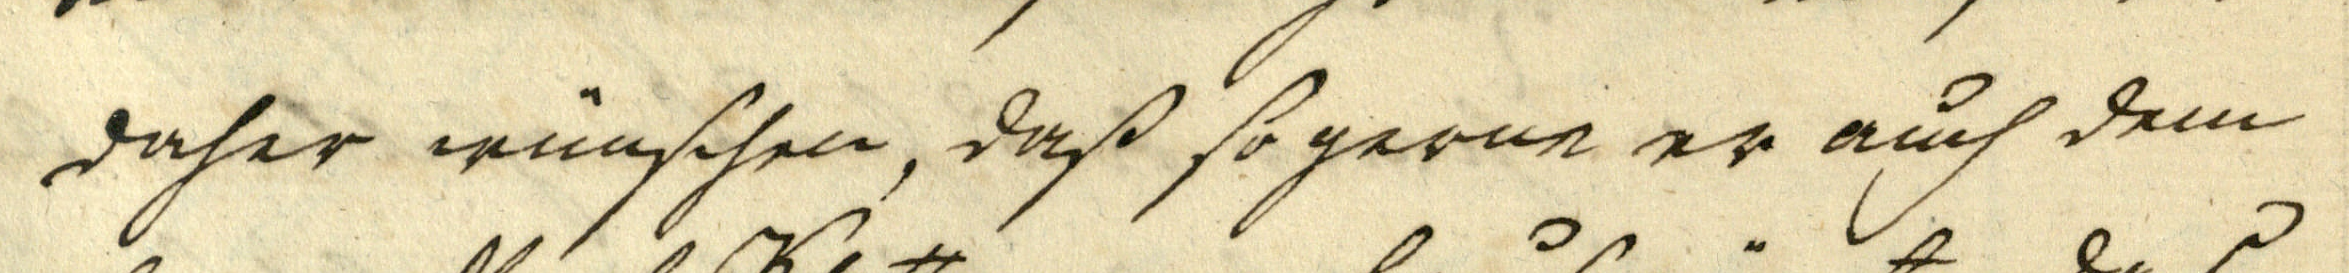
daher wünschen, daß so gerne er auch dem
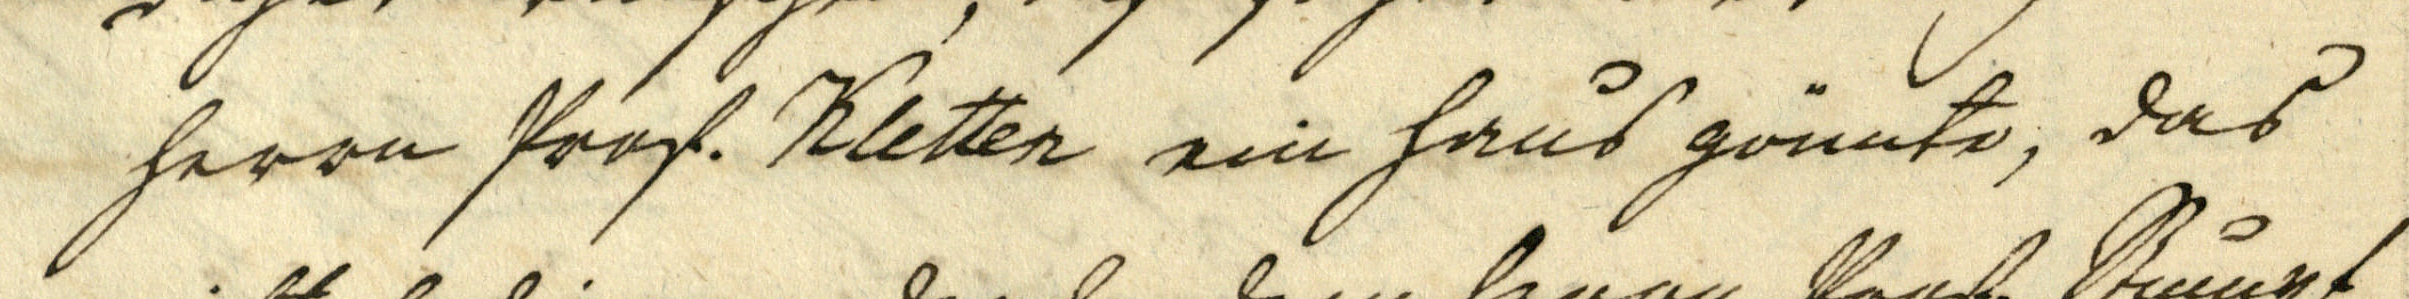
Herrn Prof. Kletten ein Haus gönnte, das
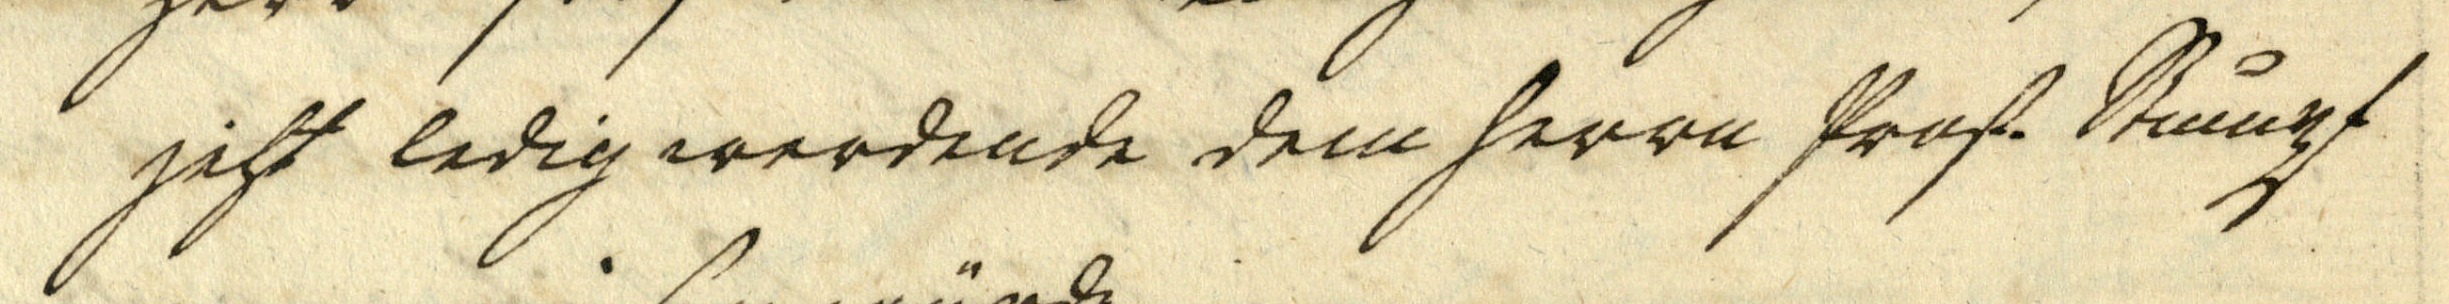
jetzt ledig werdende dem Herrn Prof. Stumpf
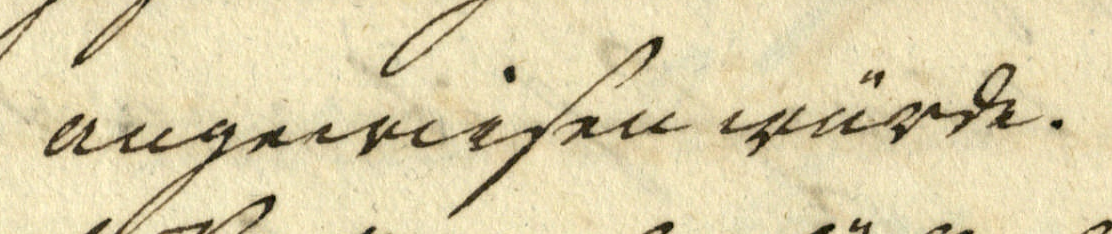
angewiesen würde.
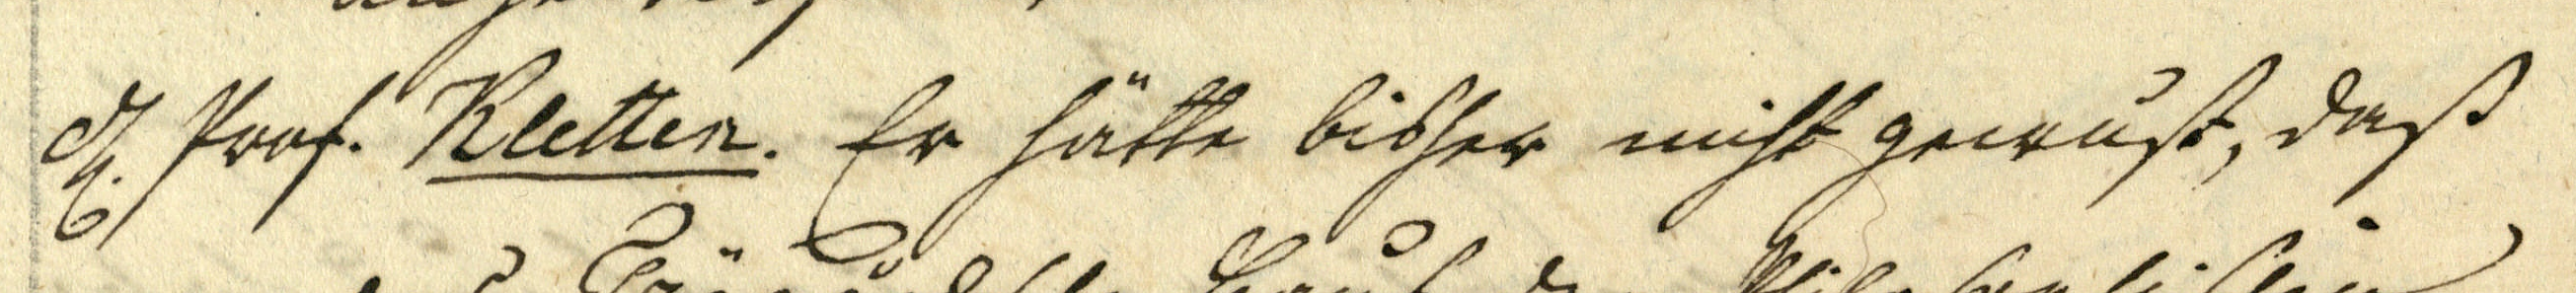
dh. Prof. Kletten. Er hätte bisher nicht gewußt, daß
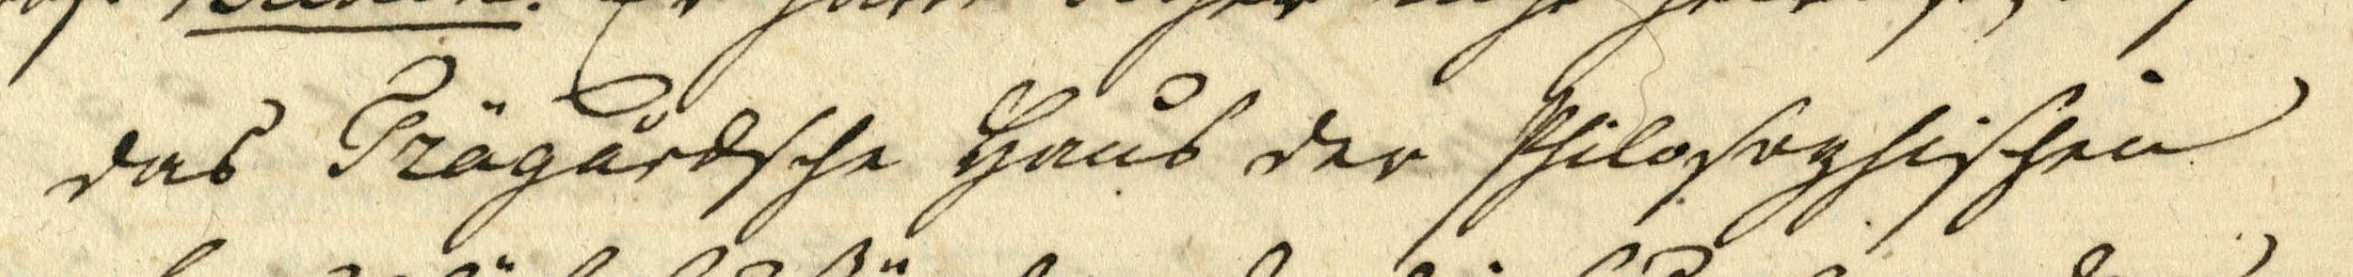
das Trägårdsche Haus der Philosophischen
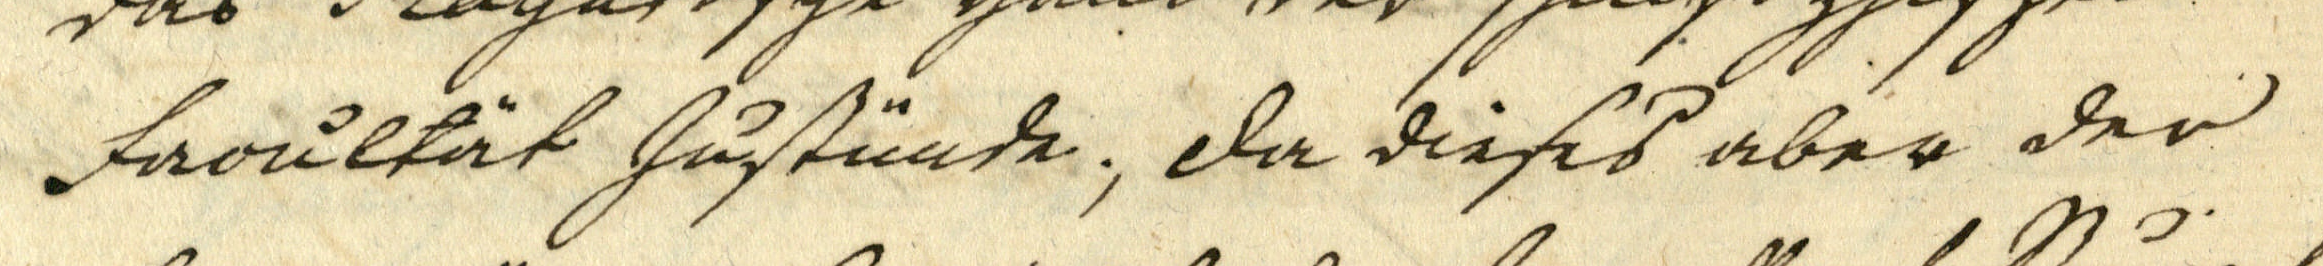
Facultät zustünde, da dieses aber der
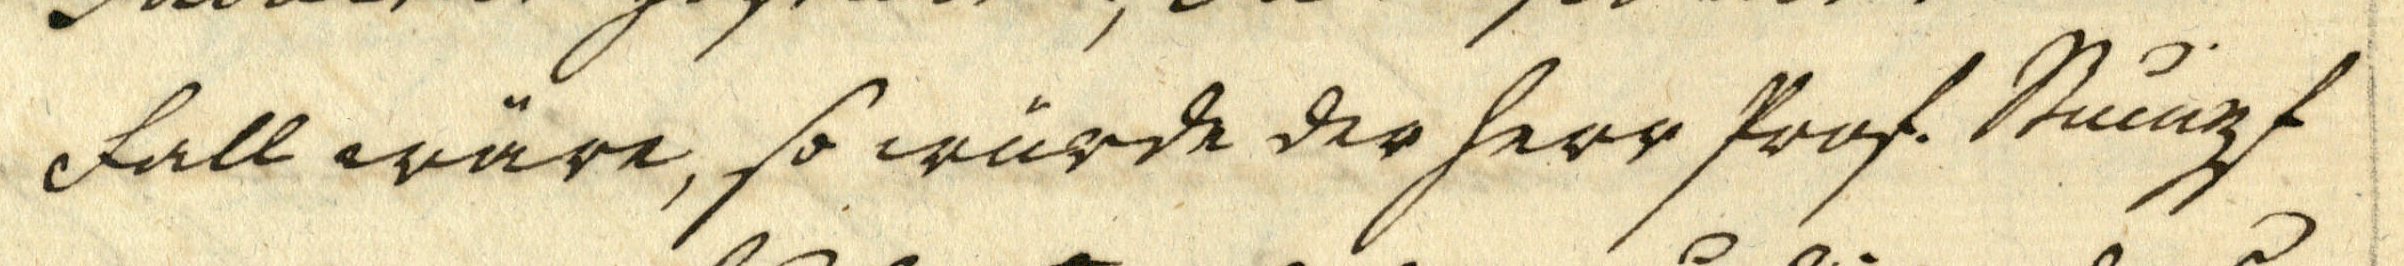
Fall wäre, so würde der Herr Prof. Stumpf
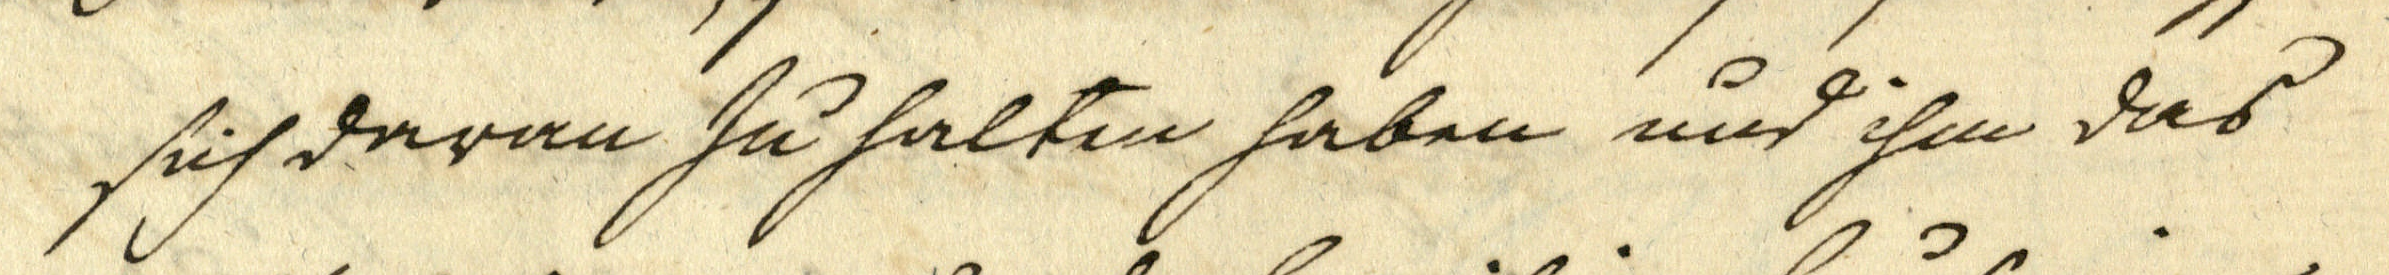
sich daran zu halten haben und ihm das
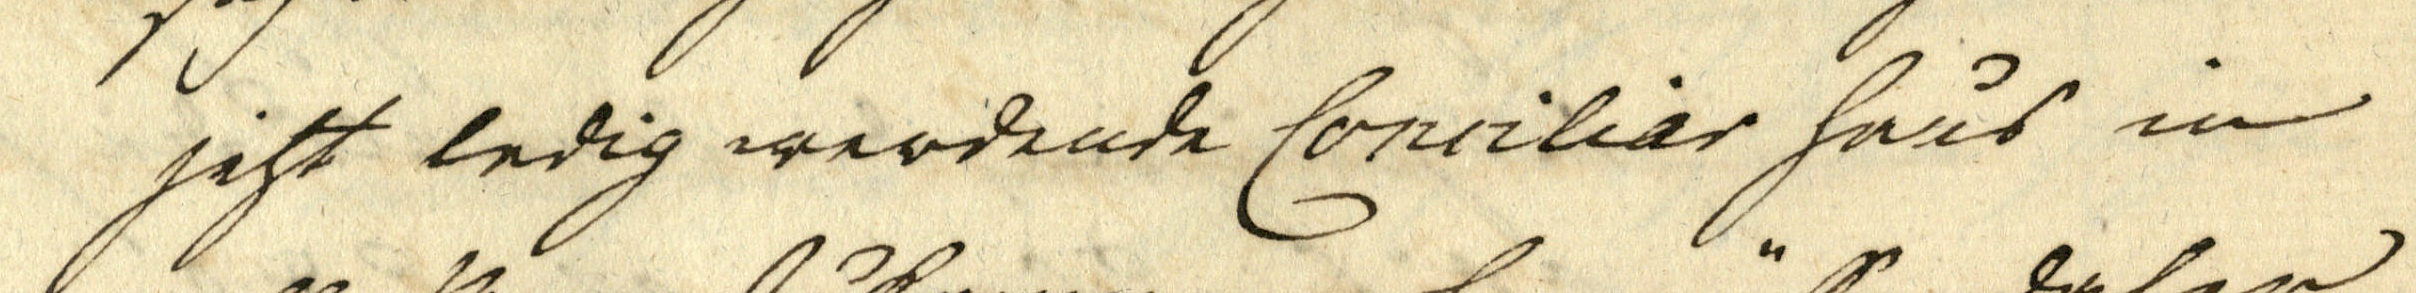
jetzt ledig werdende Conciliar Haus in
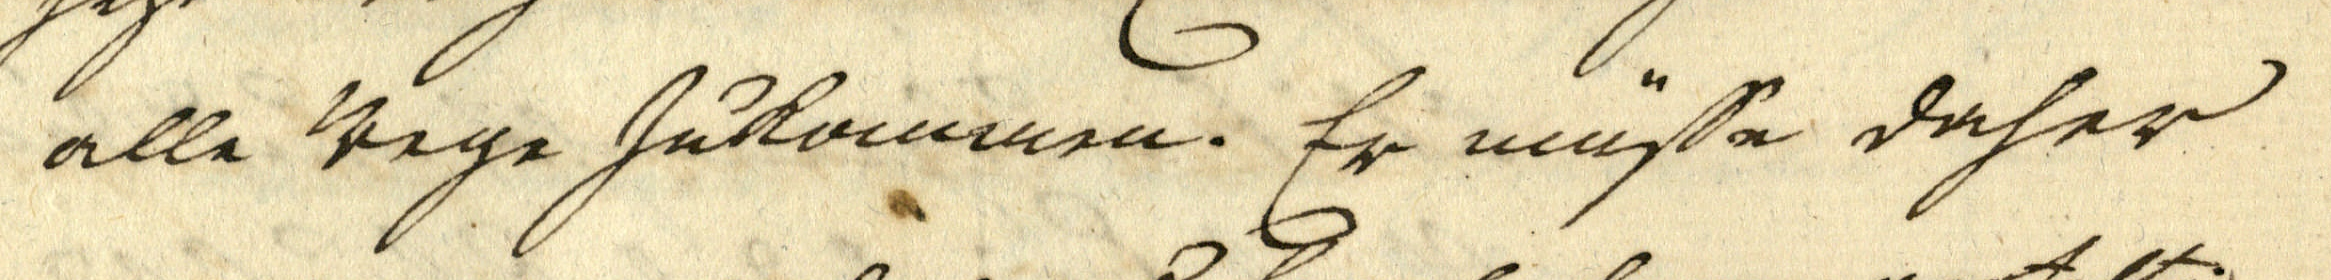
alle Wege zukommen. Er müsse daher
